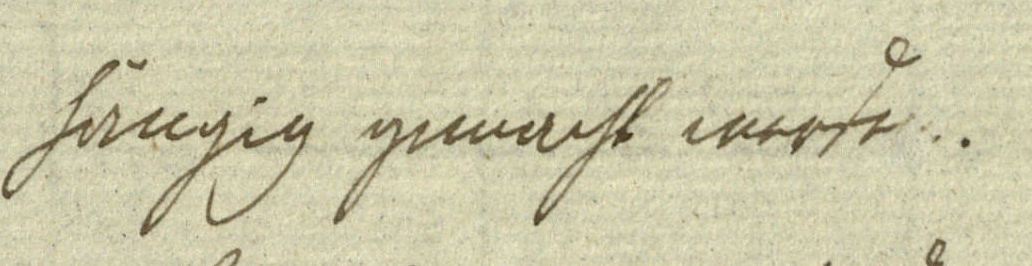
hängig gemacht werde.
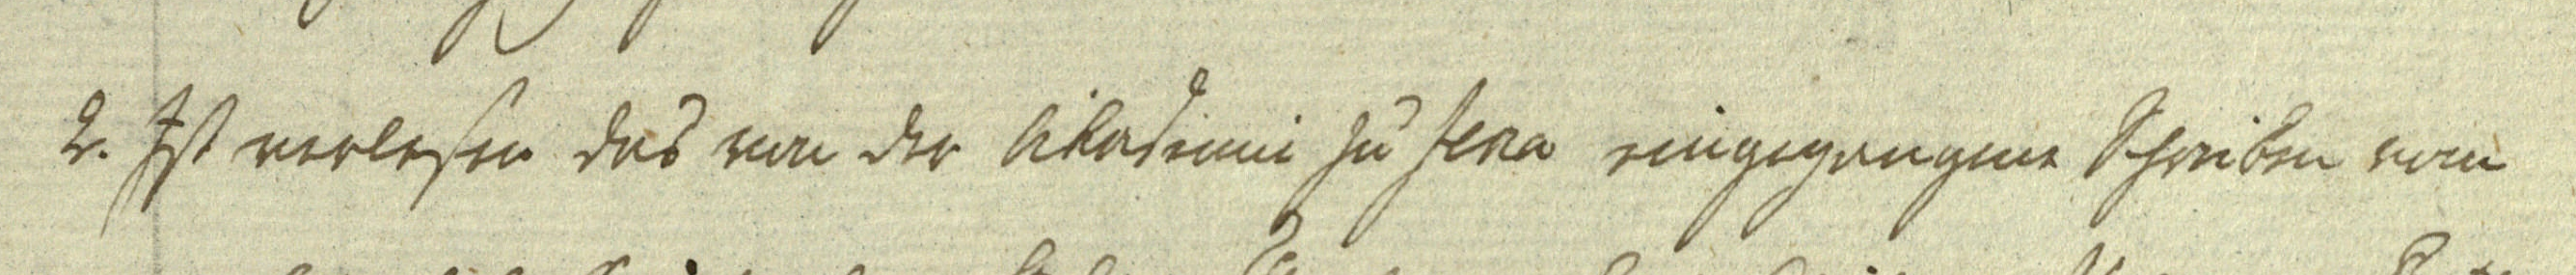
2. Ist verlesen das von der Akademie zu Jena eingegangene Schreiben vom
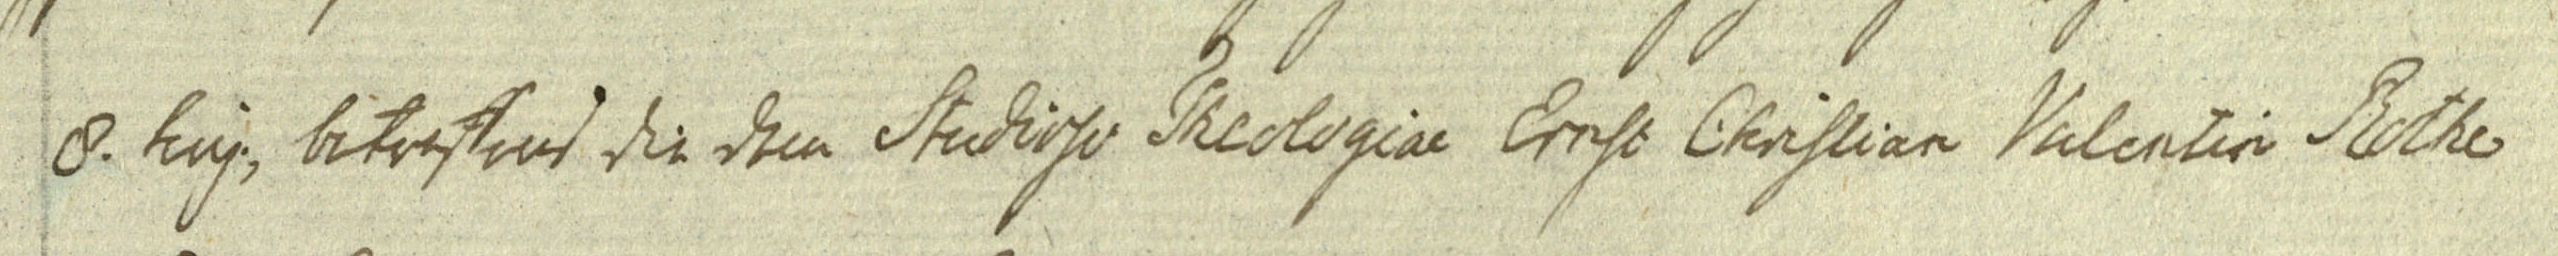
8. huj., betreffend die dem Studioso Theologiae Ernst Christian Valentin Rothe¬
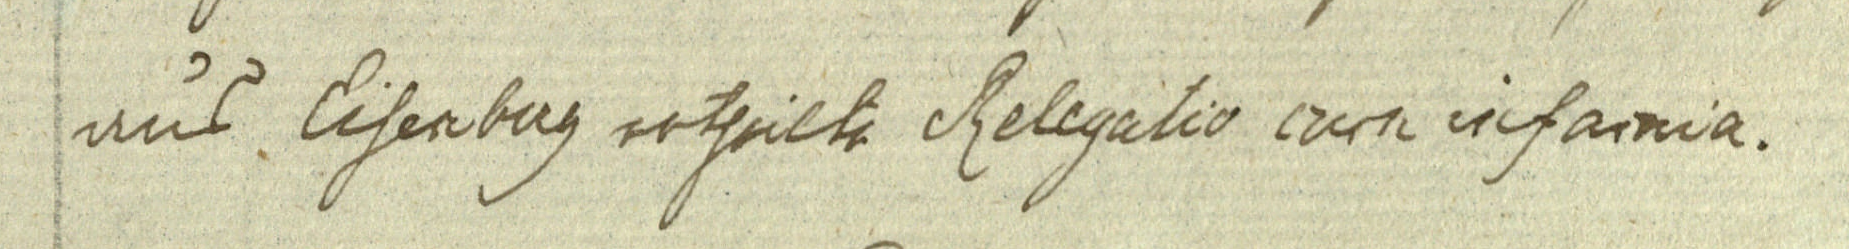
aus Eisenberg ertheilte Relegatio cum infamia.
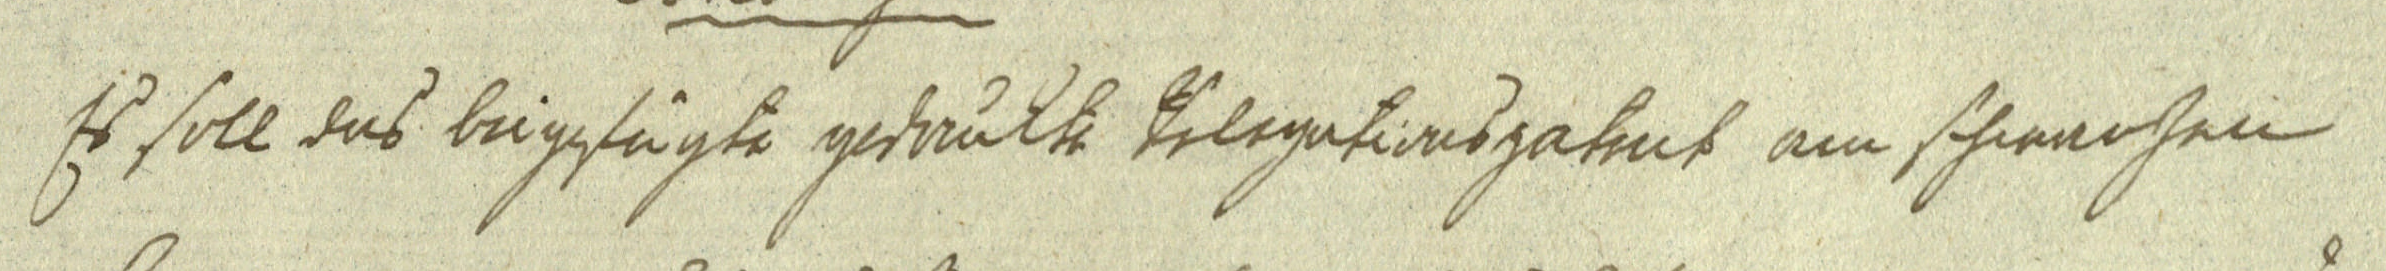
Es soll das beigefügte gedruckt Relegationspatent am schwarzen
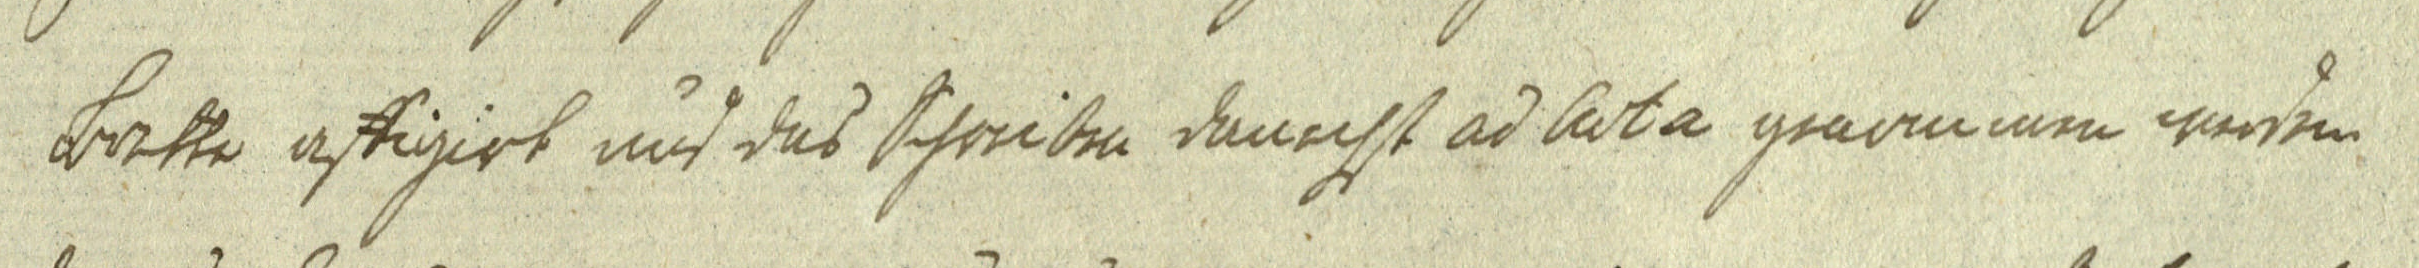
Brette affigirt und das Schreiben danechst ad Acta genommen werden.
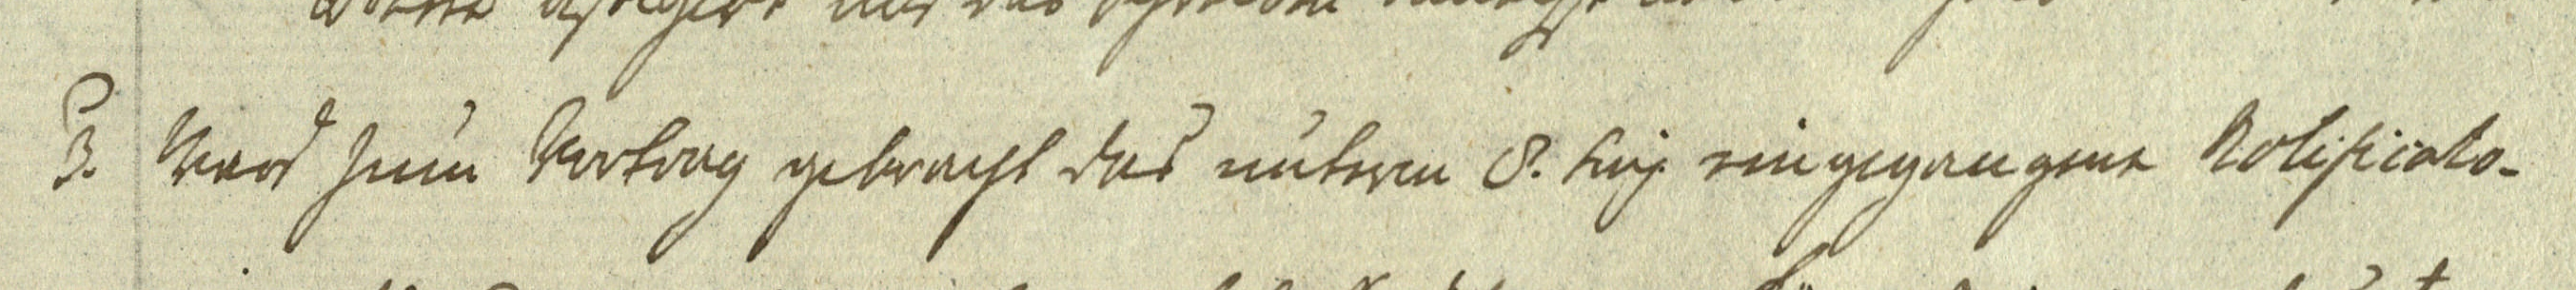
3. Ward zum Vortrag gebracht das unterm 8. huj. eingegangene Notificato¬
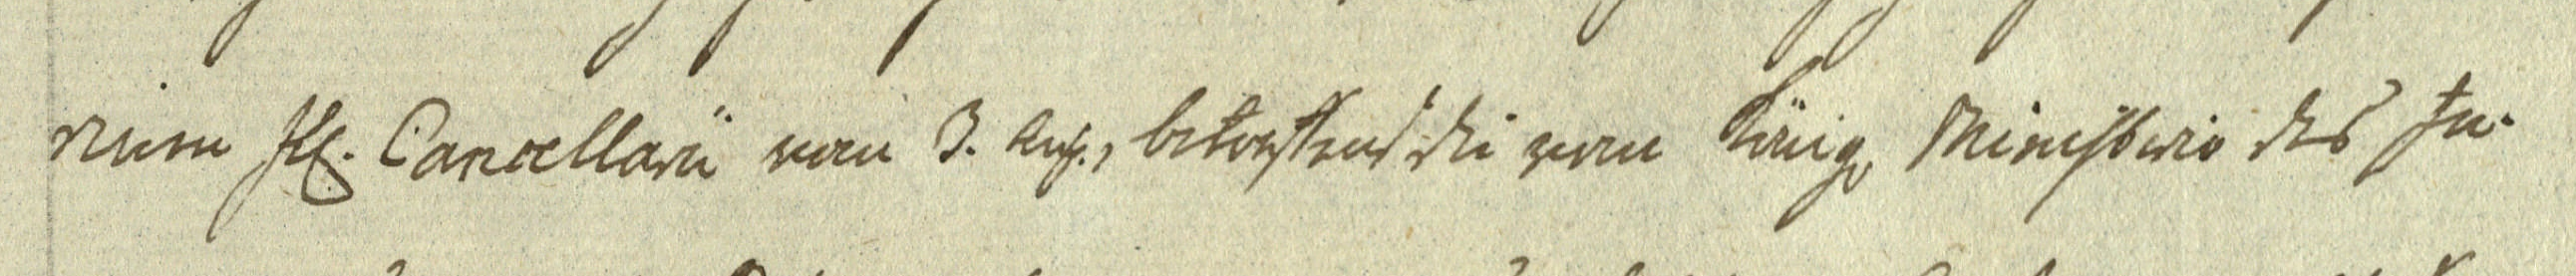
rium Ill. Cancellarii vom 3. huj., betreffend die vom Königl Ministerio des In¬
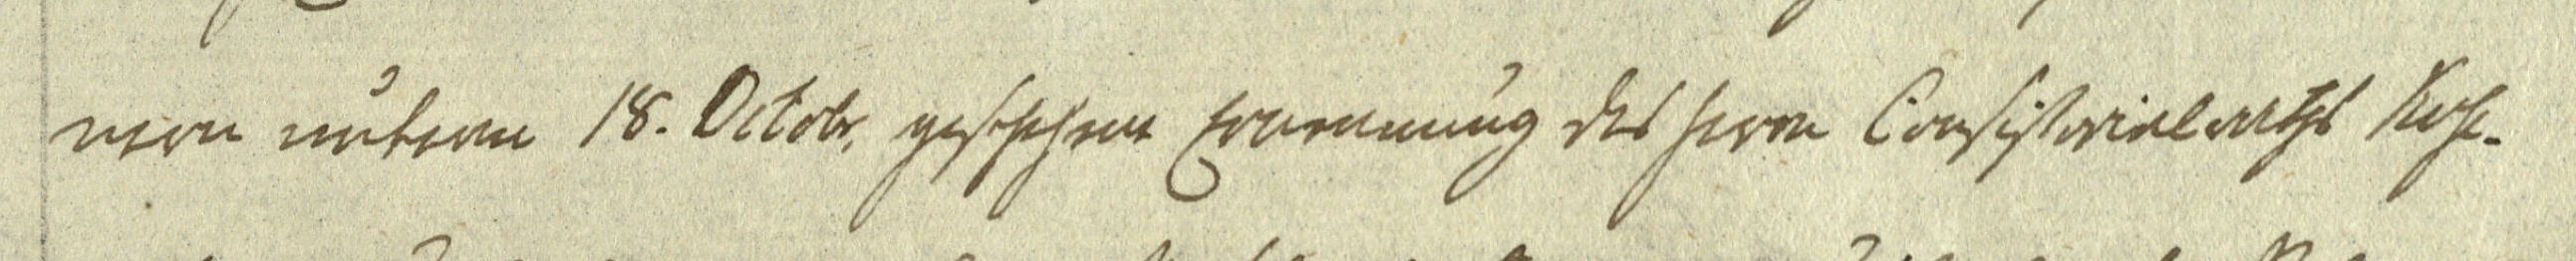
nern unterm 18. Octobr. geschehene Ernennung des Herrn Consistorialraths Kose¬
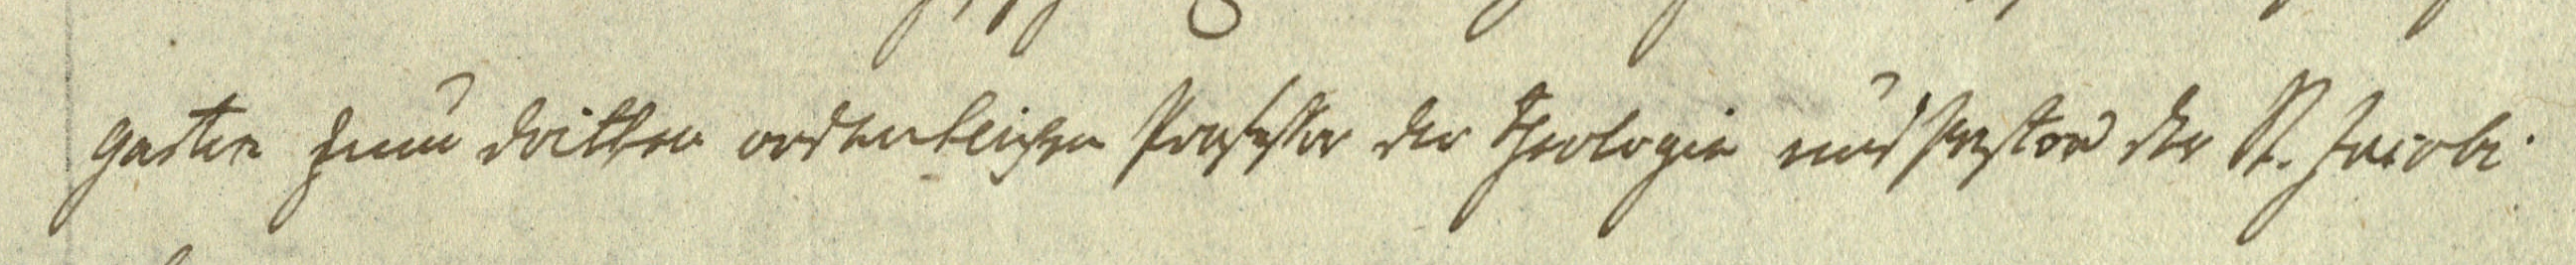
garten zum dritten ordentlichen Professor der Theologie und Pastor der St. Jacobi
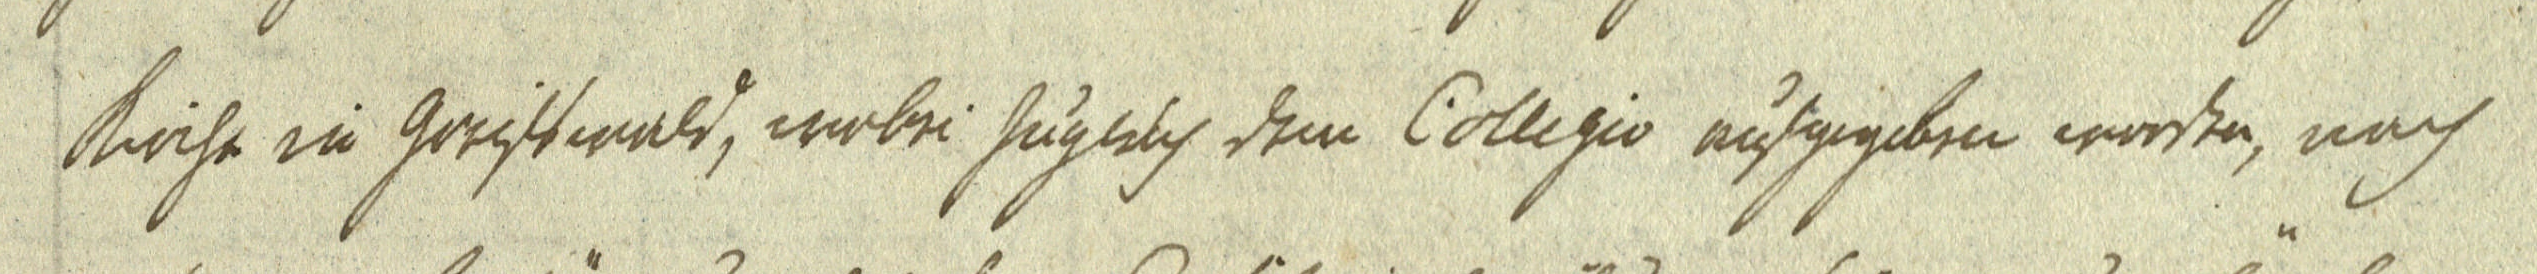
Kirche in Greifswald, wobei zugleich dem Collegio aufgegeben worden, nach
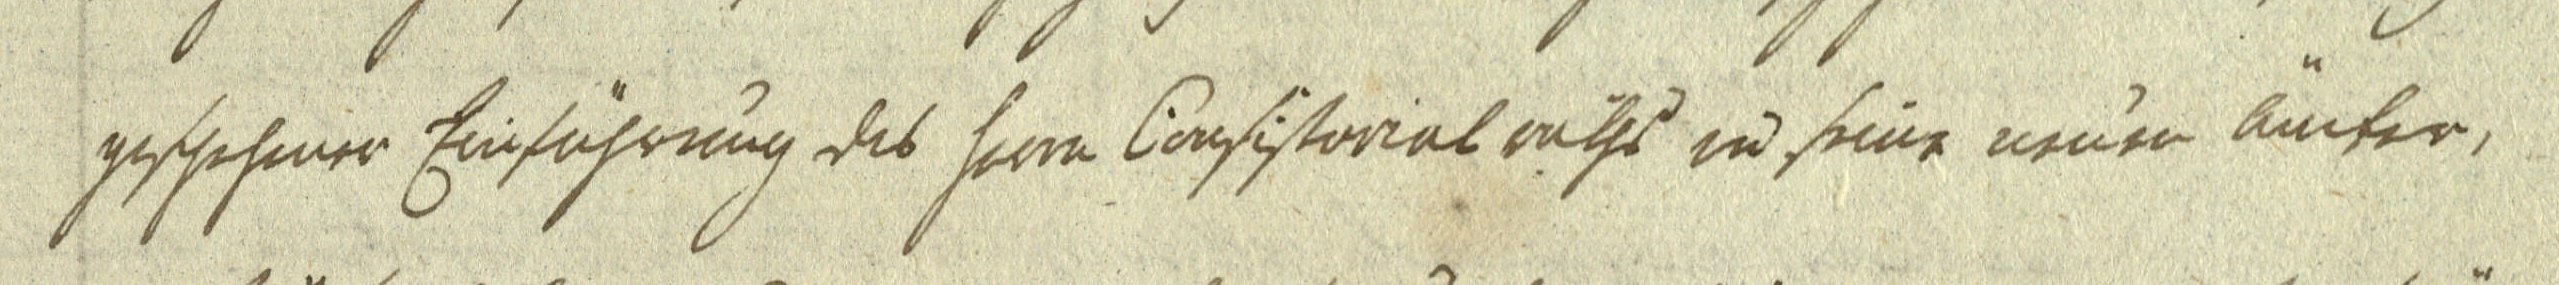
geschehener Einführung des Herrn Consistorialraths in seine neuen Ämter,
